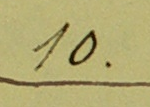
10
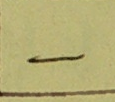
-
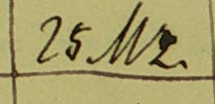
25. Mr.
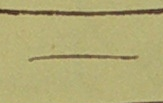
-
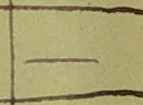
-
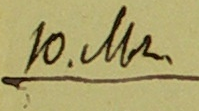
10. Mr.
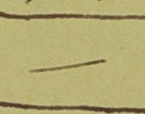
-
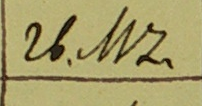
26. Mr.
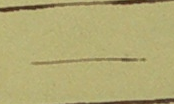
-
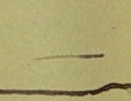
-
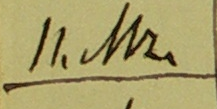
11. Mr
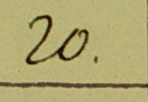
20
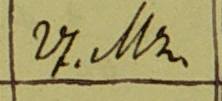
27. Mr
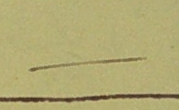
-
